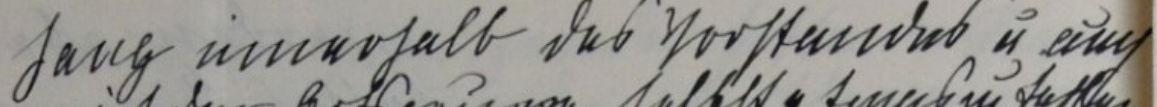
hang innerhalb des Vorstandes u. auch
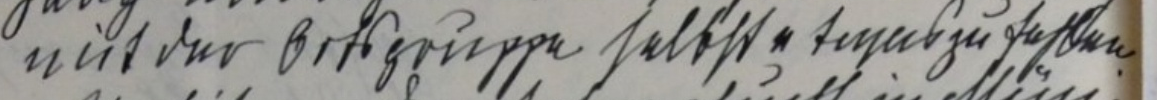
mit der Ortsgruppe selbst u. figas zu fehlen.
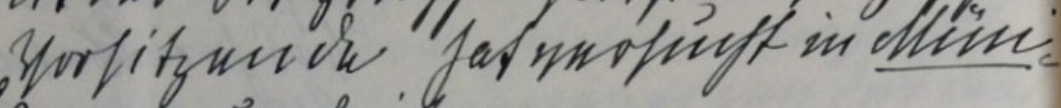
Virsitzende hat versucht in Mün
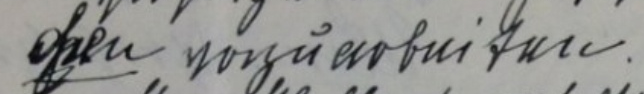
chen vorzuarbeiten.
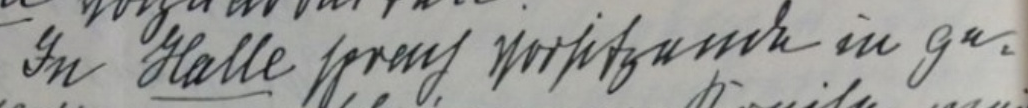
In Halle sprach Vorsitzende in ge
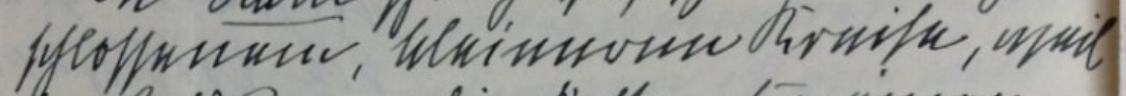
schlossenem, kleinem Kreise, weil
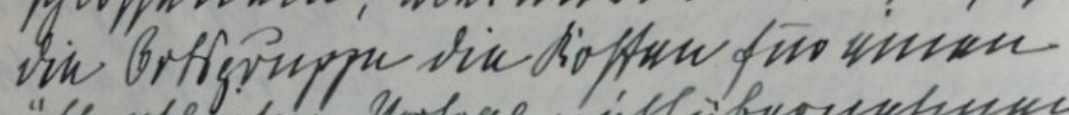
die Orsgruppe die Kräfte für einen
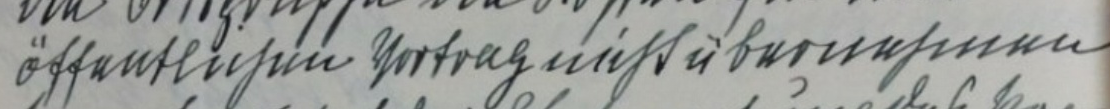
öffentlichen Vortrag nicht übernehmen
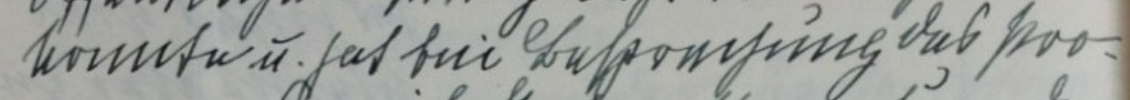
konnte u. hat bei Besprechung des Pro
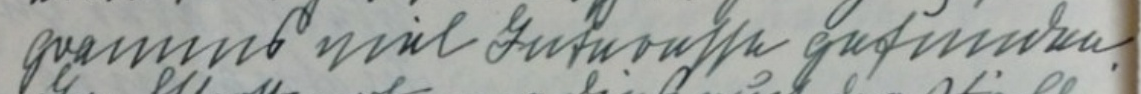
gramms viel Interesse gefunden.
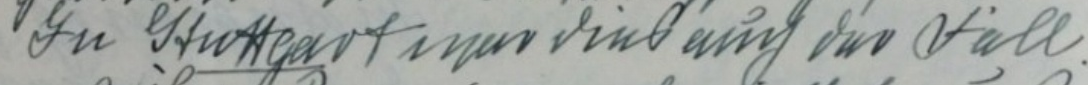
IN Stuttgat war dies auch der Fall.
